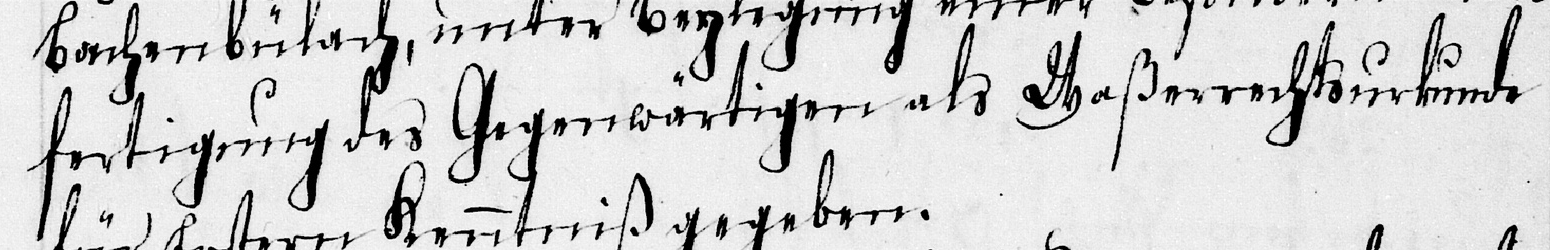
fertigung des Gegenwärtigen als Waßerrechtsurkunde
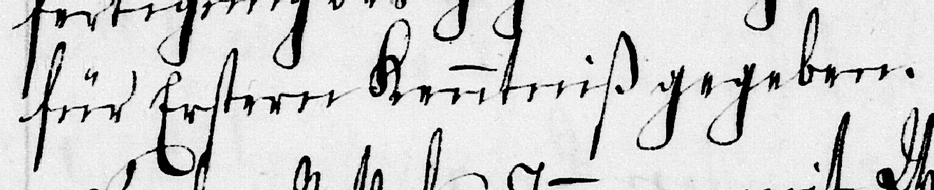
für Erstern Kenntniß gegeben.
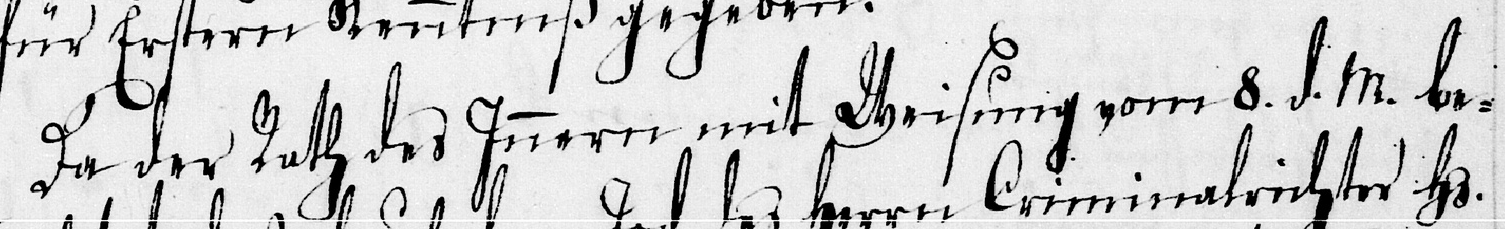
Da der Rath des Innern mit Weisung vom 8. d. M. be¬
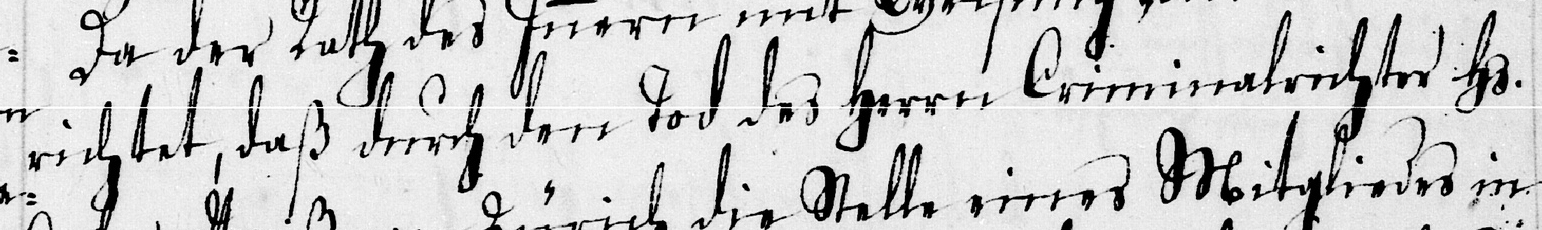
richtet, daß durch den Tod des Herrn Criminalrichter Hs.
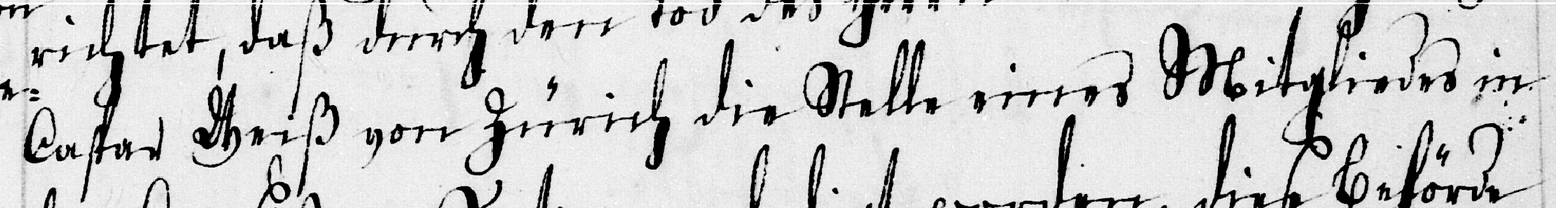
Caspar Weiß von Zürich die Stelle eines Mitgliedes in
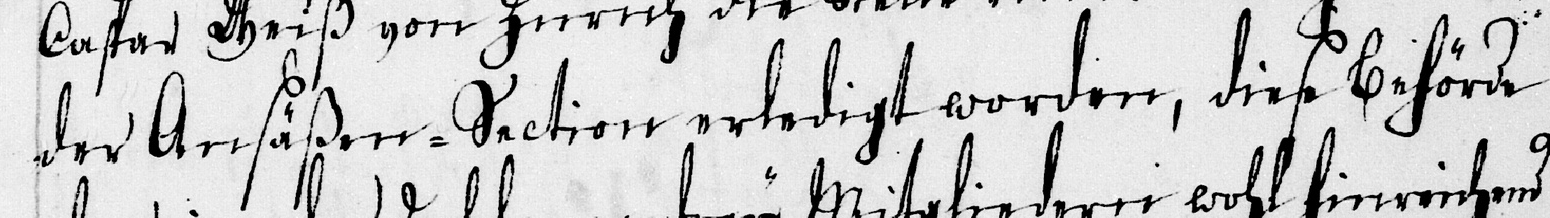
der Ansäßen-Section erledigt worden, diese Behörde
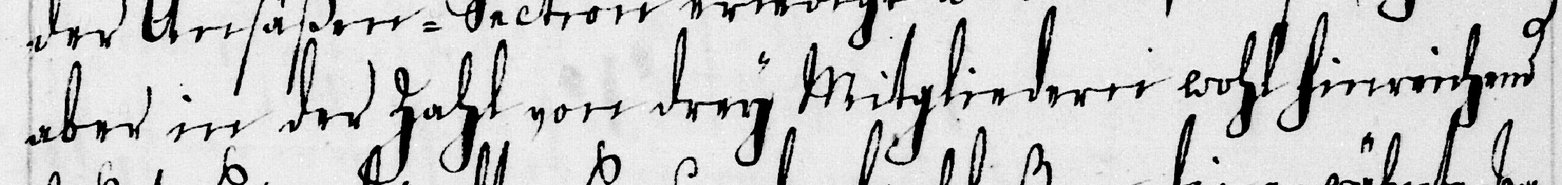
aber in der Zahl von drey Mitgliedern wohl hinreichend
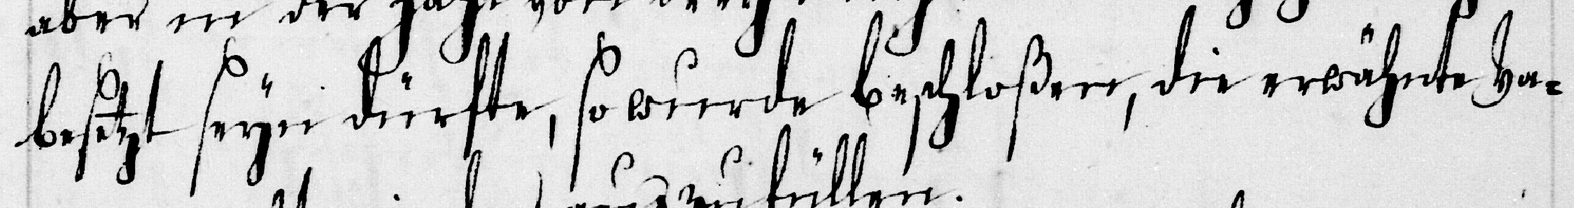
besetzt seyn dürfte, so wurde beschloßen, die erwähnte Va¬
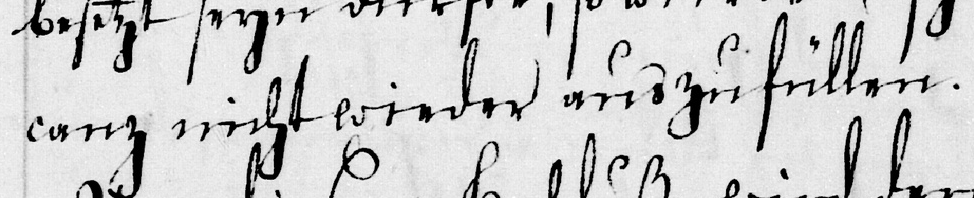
canz nicht wieder auszufüllen.
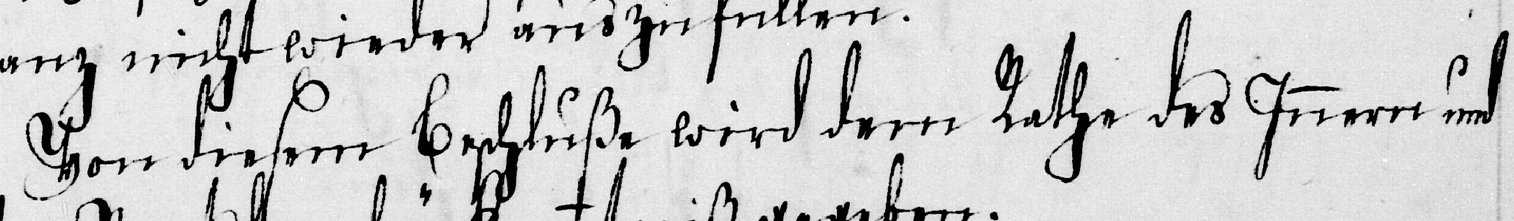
Von diesem Beschluße wird dem Rathe des Innern und
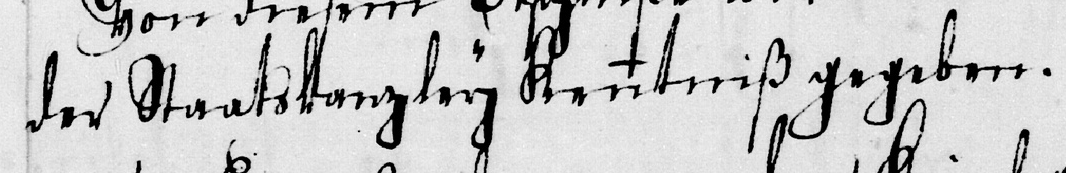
der Staatskanzley Kenntniß gegeben.
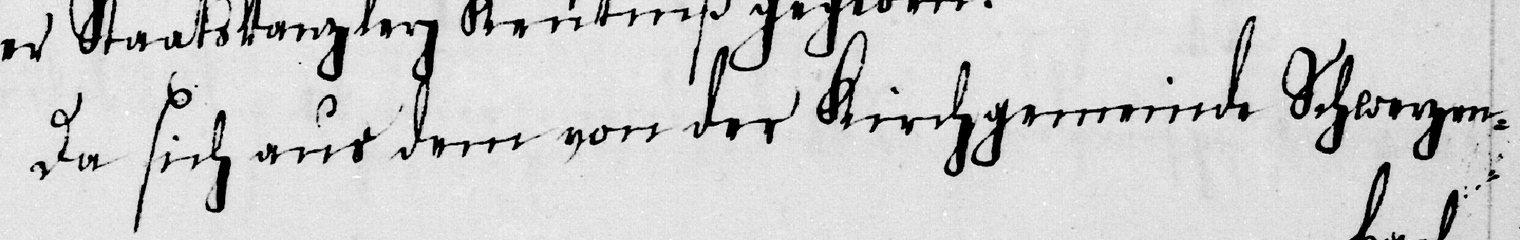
Da sich aus dem von der Kirchgemeinde Schwerzen-
